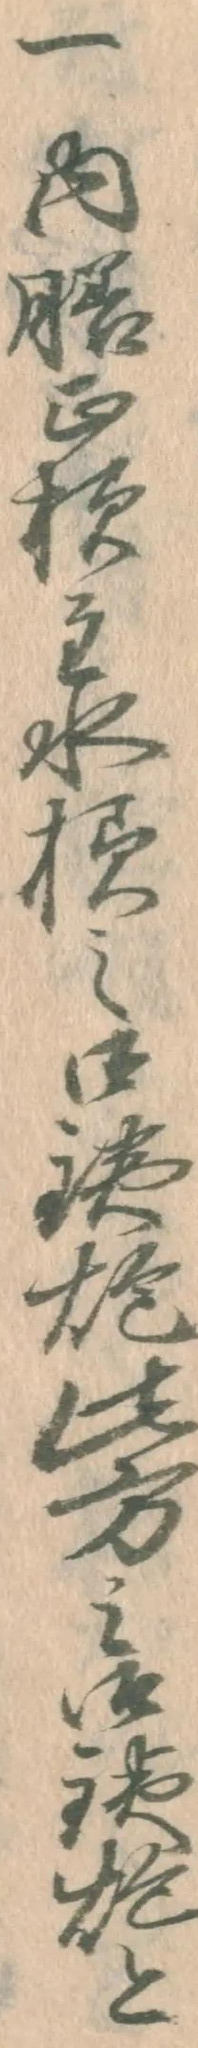一内膳正様主水様之御鉄炮此方之御鉄炮と
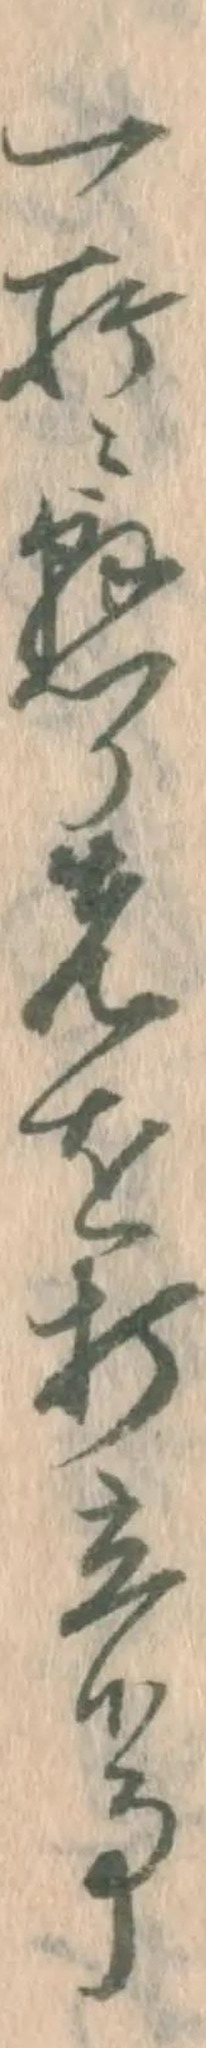一所に懸り先を打立候事
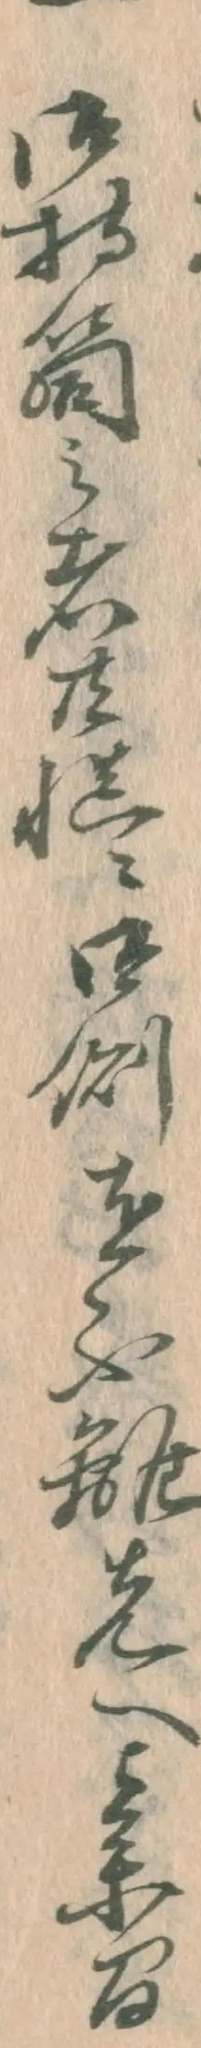一御持筒之者共慥に御例をふ離先へ被参間
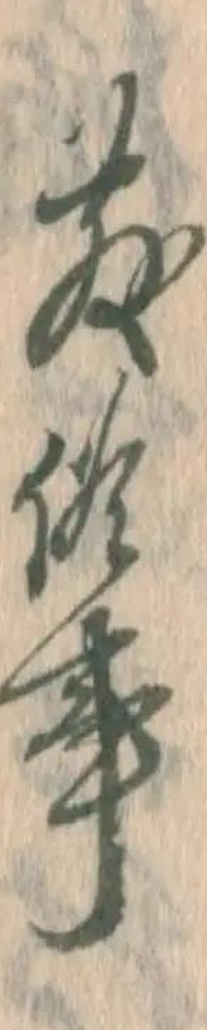敷候事
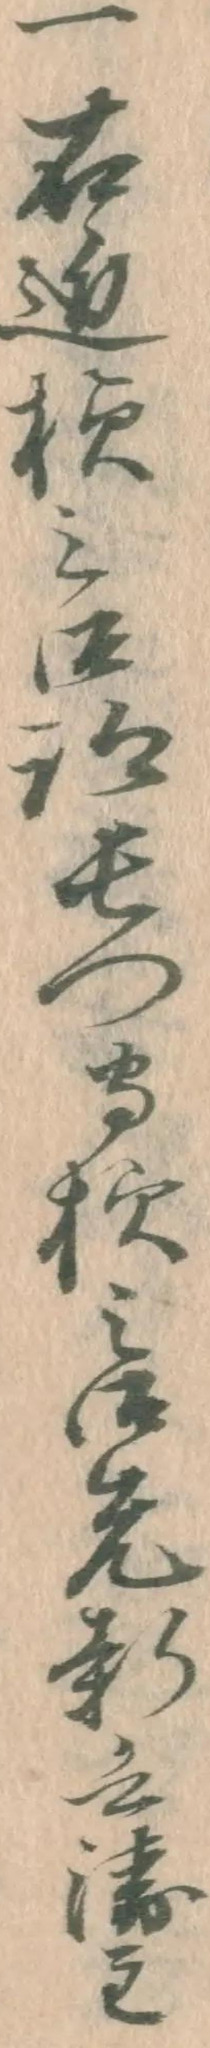一右近様之御跡長門守様之御先新兵衛主
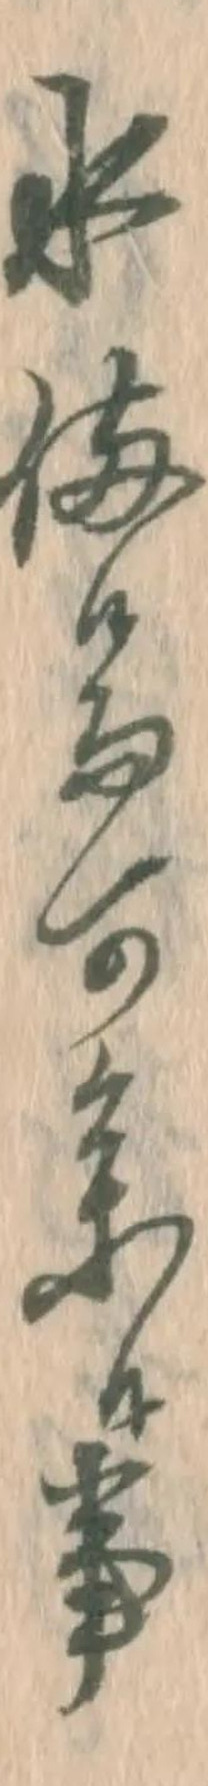水備候而可参候事
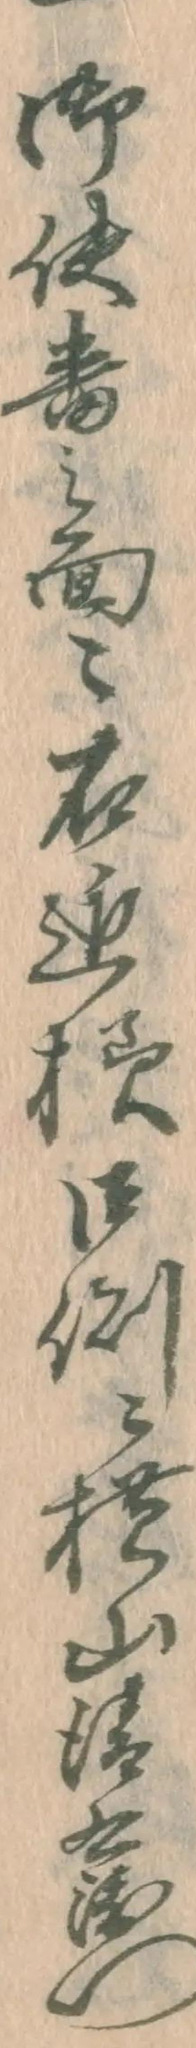一御使番之面々右近様御例に横山清右衛門
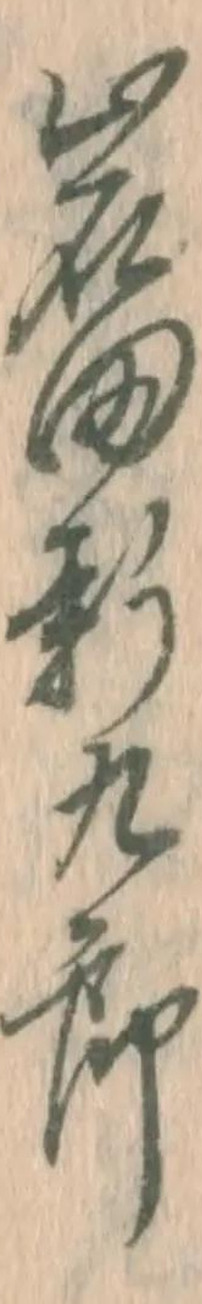岩田新九郎
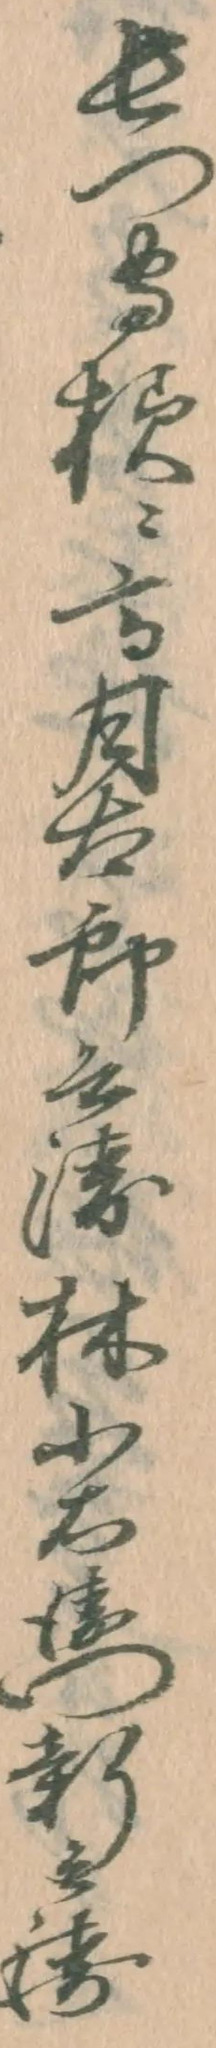長門守様に高月太郎兵衛林小右衛門新兵衛
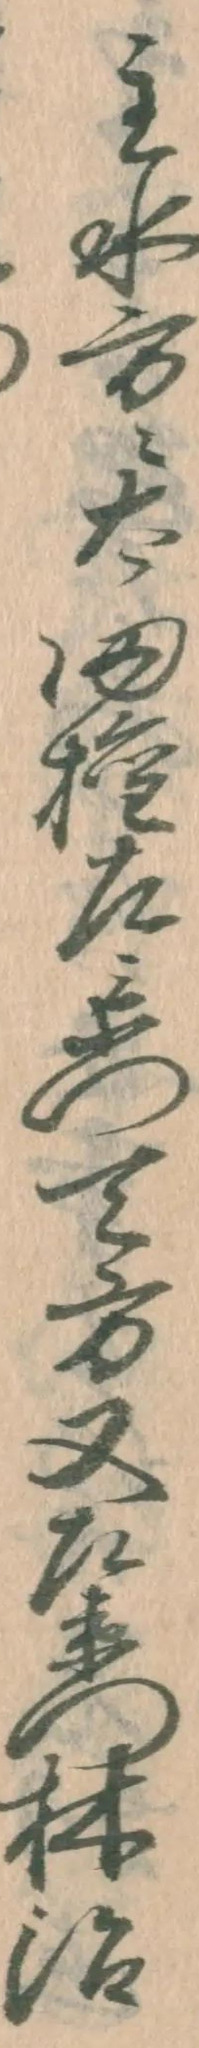主水方に太田権左衛門天方又左衛門林治
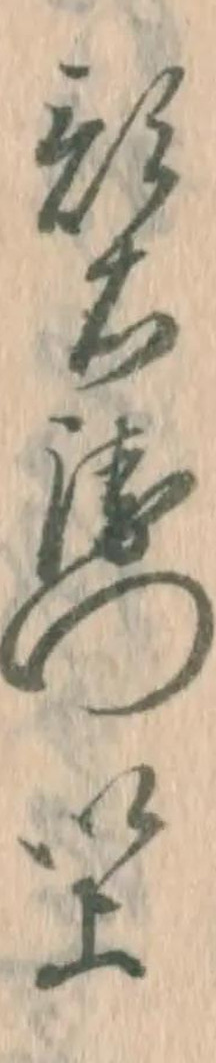部右衛門以上
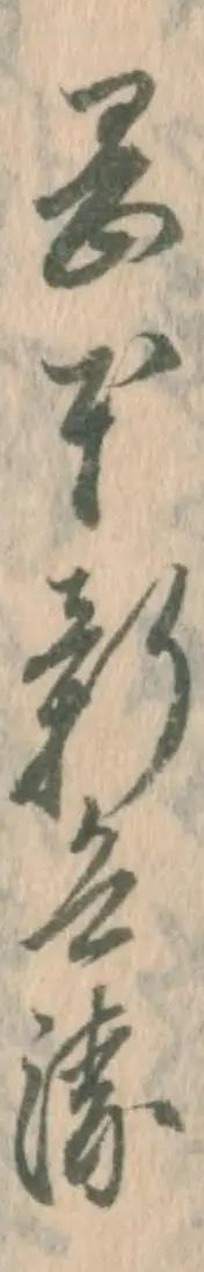岡本新兵衛
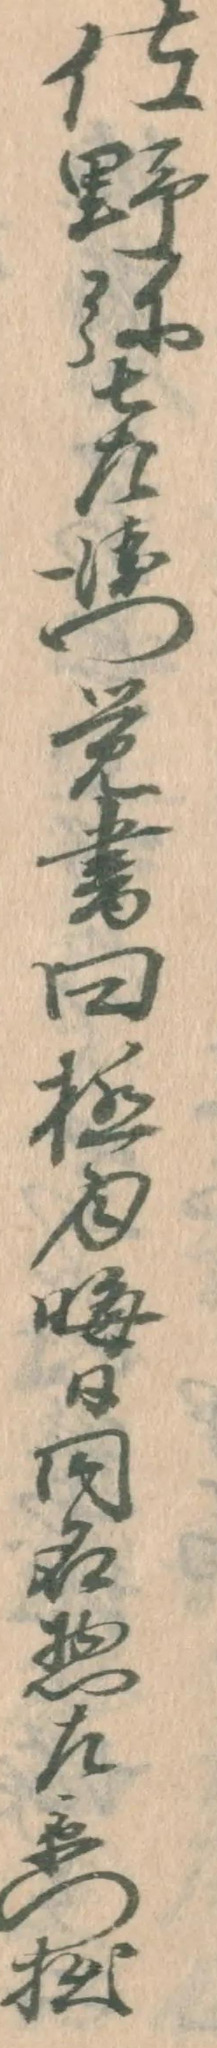佐野弥七左衛門覚書曰極月晦日同名惣左衛門拙
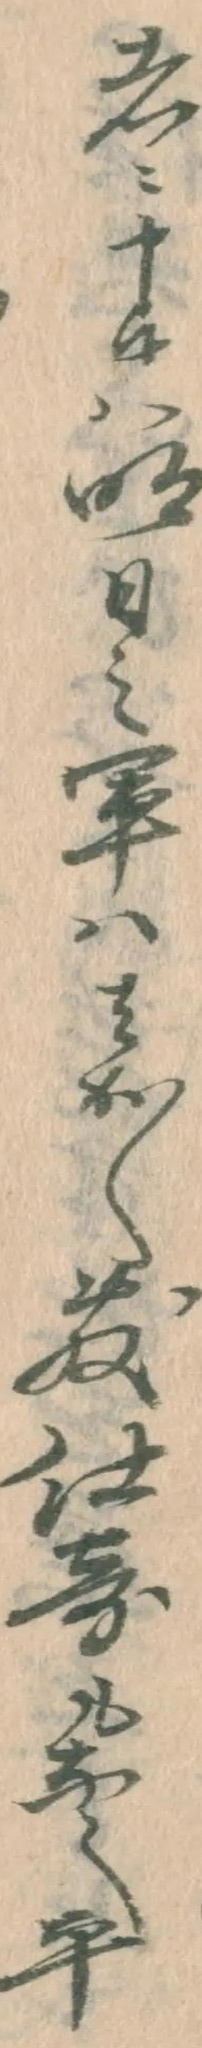者に申候は明日之軍は者加〳〵敷仕寄もなく卒
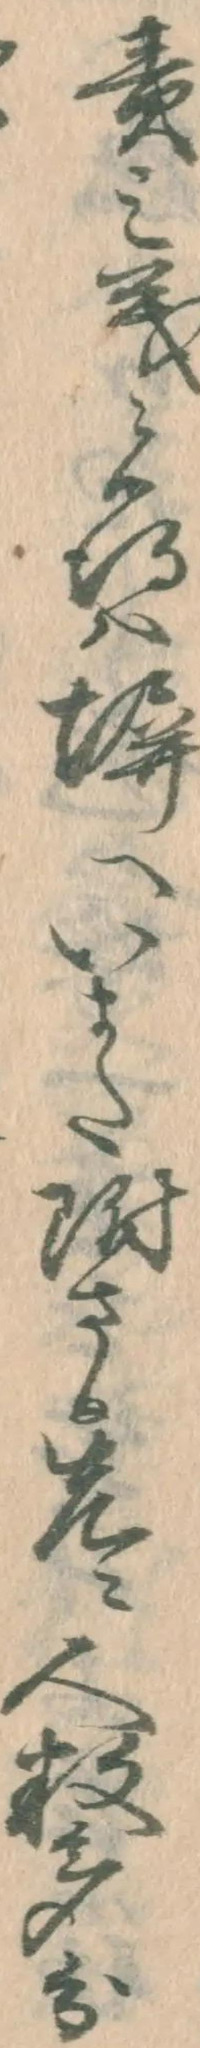責之義に候得は塀へいまた附さる先に人数多分
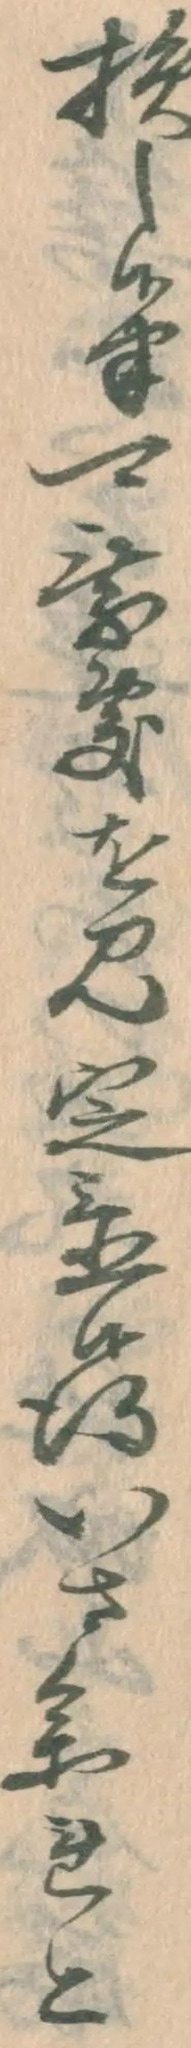損し候半可乗敷を見定置候得いさ参連と
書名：切支丹御退治記 49巻. [5]
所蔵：国立国会図書館 National Diet Library, JAPAN
